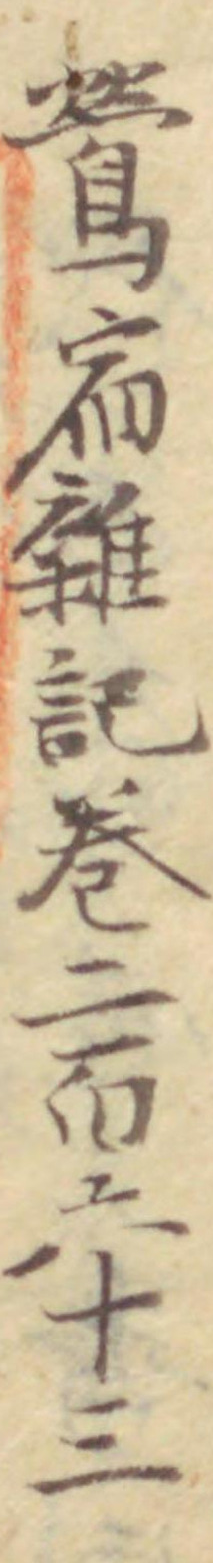鶯宿雑記巻二百六十三
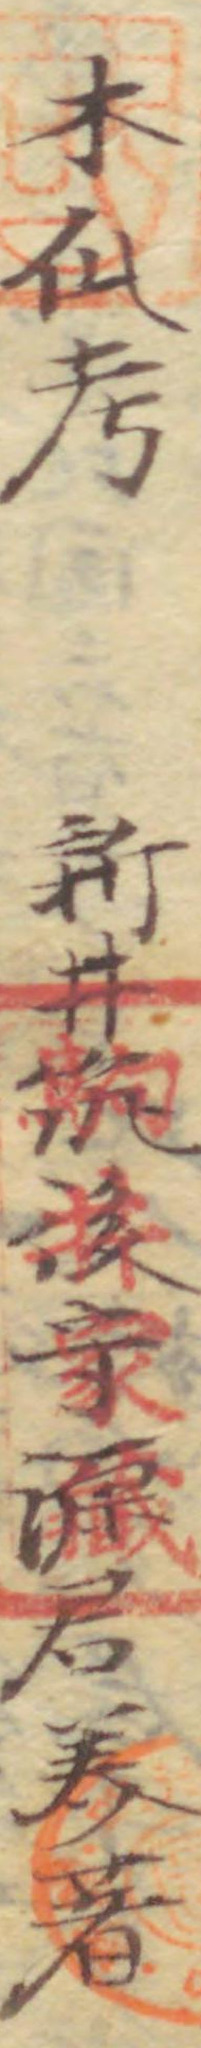木瓜考新井筑後守源君美著
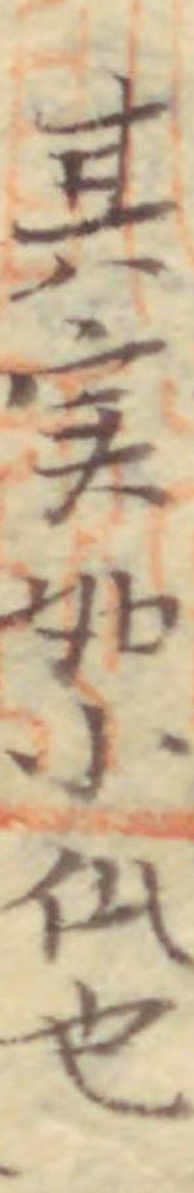其実如に瓜也
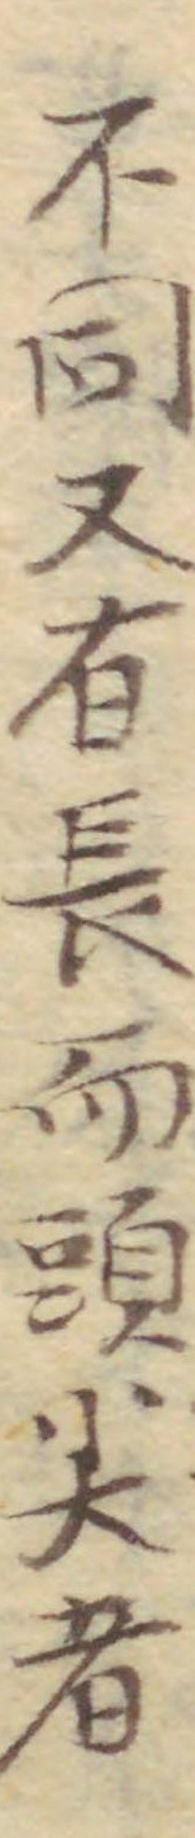不同又有長而頭尖者
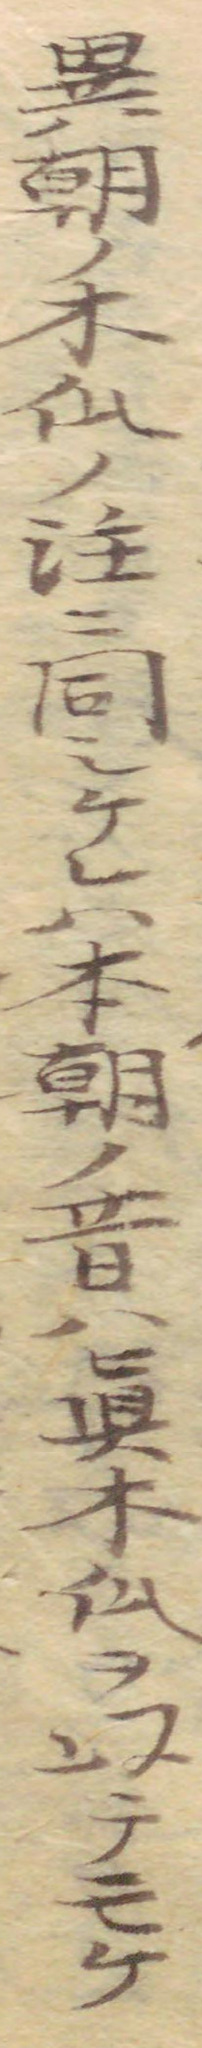異朝ノ木瓜ノ注ニ同シケレハ本朝ノ昔ハ真木瓜ヲ以テモケ
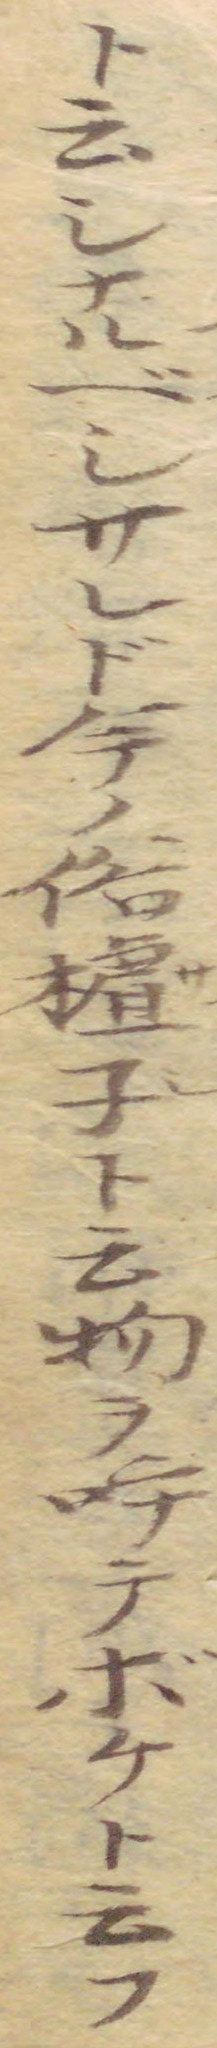ト云シナルベシサレド今ノ俗樝子ト云物ヲ呼テボケト云フ

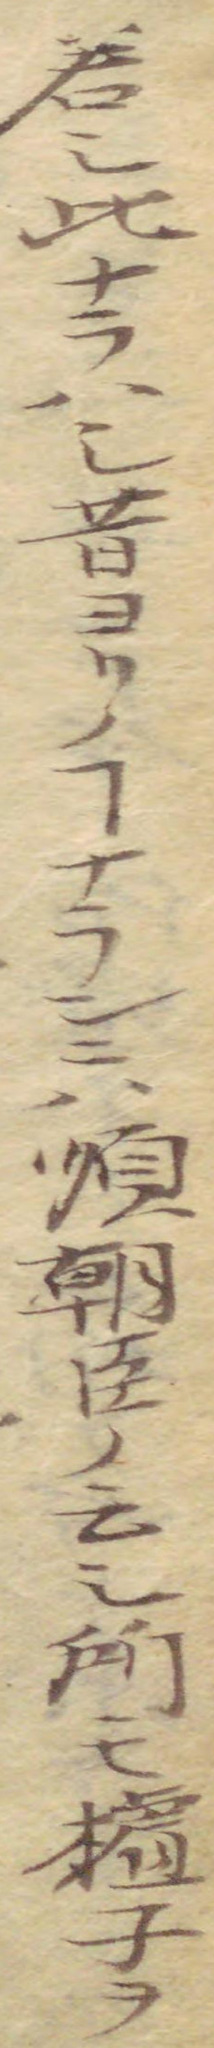若シ此ナラハシ昔ヨリノコトナランニハ順朝臣ノ云シ所モ樝子ヲ
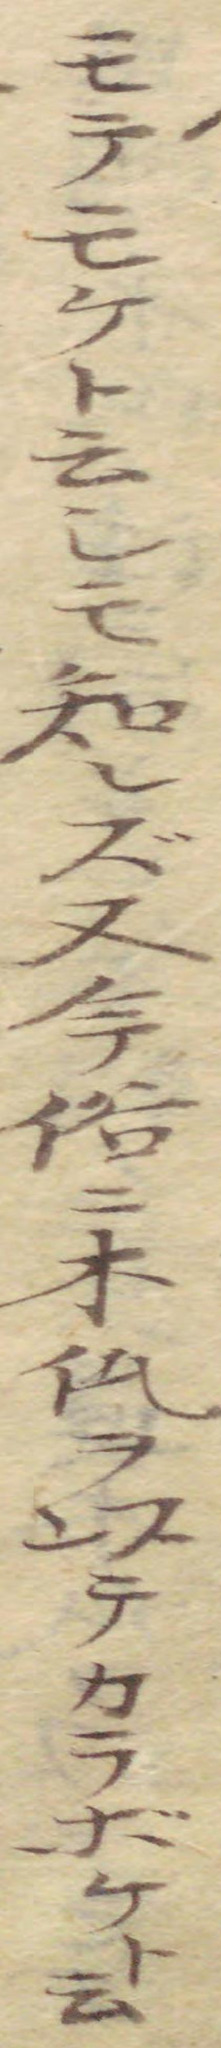モテモケト云シモ知レズ又今俗ニ木瓜ヲ以テカラボケト云
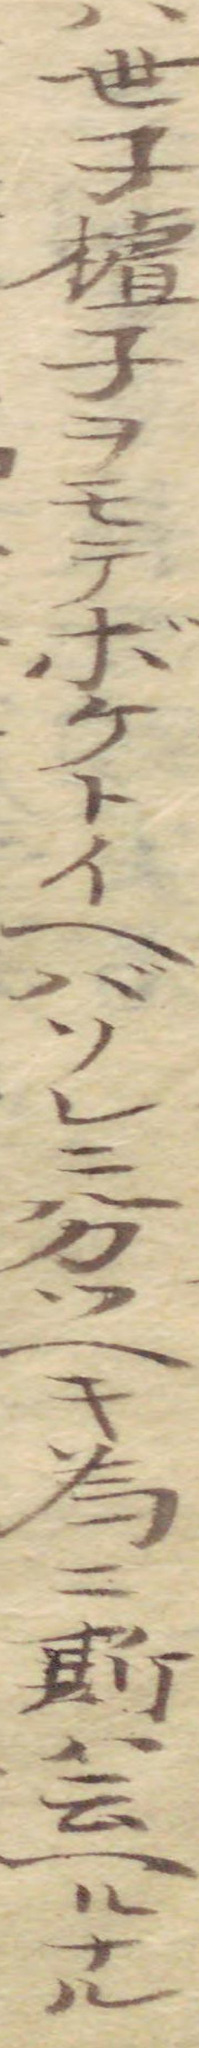ハ世子樝子ヲモテボケトイヘバソレニ分ツヘキ爲ニ斯ハ云ヘルナル
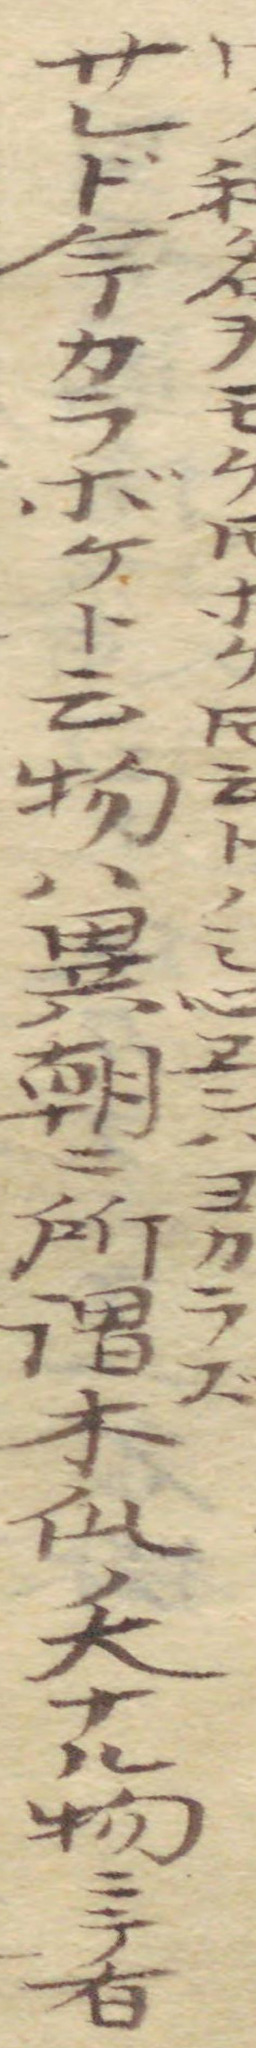サレド今カラボケト云物ハ異朝ニ所謂木瓜ノ大ナル物ニテ有
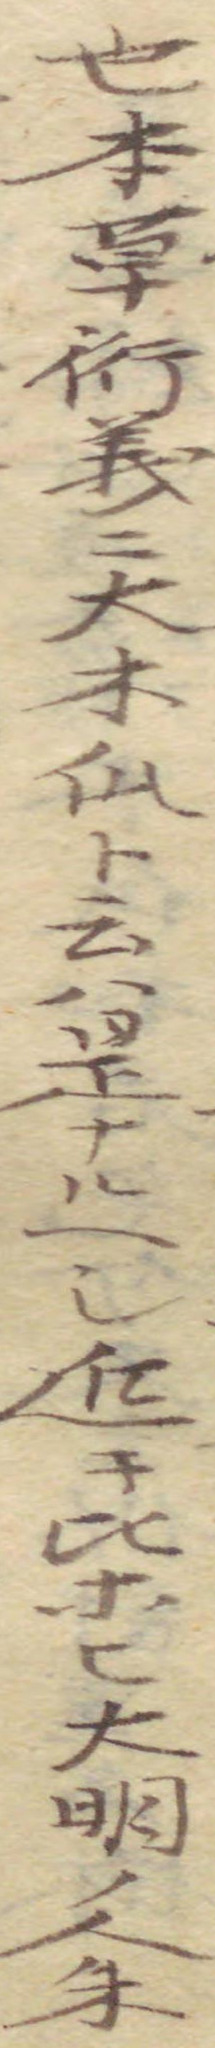也本草衍義ニ大木瓜ト云ハ是ナルヘシ近キ比ホヒ大明ノ人朱
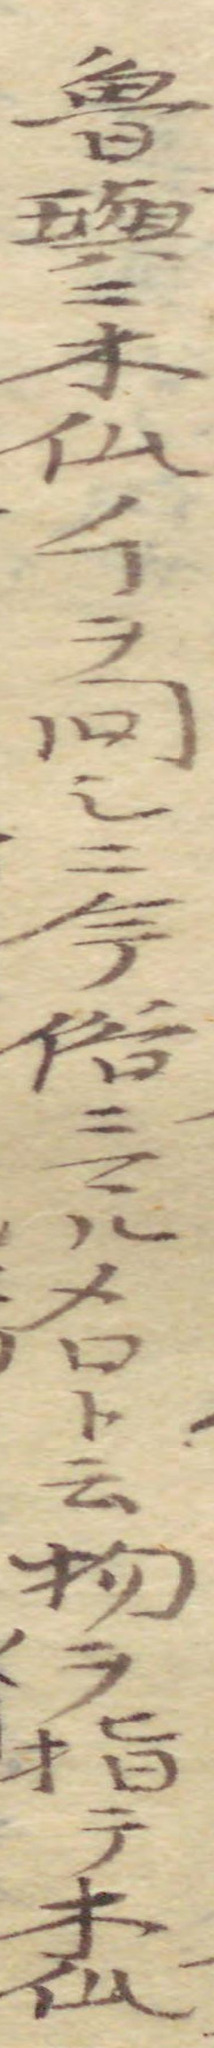魯璵ニ木瓜ノコトヲ問シニ今俗ニマルメロト云物ヲ指テ木瓜
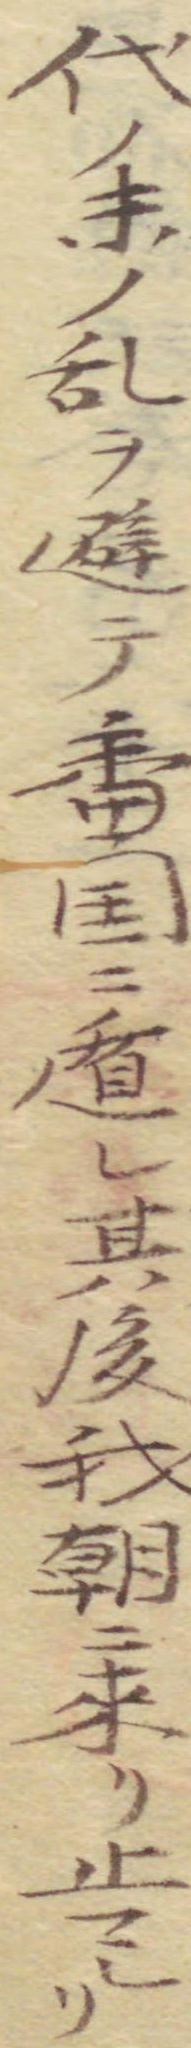代ノ末ノ乱ヲ避テ番国ニ遁レ其後我朝ニ来リ止マレリ
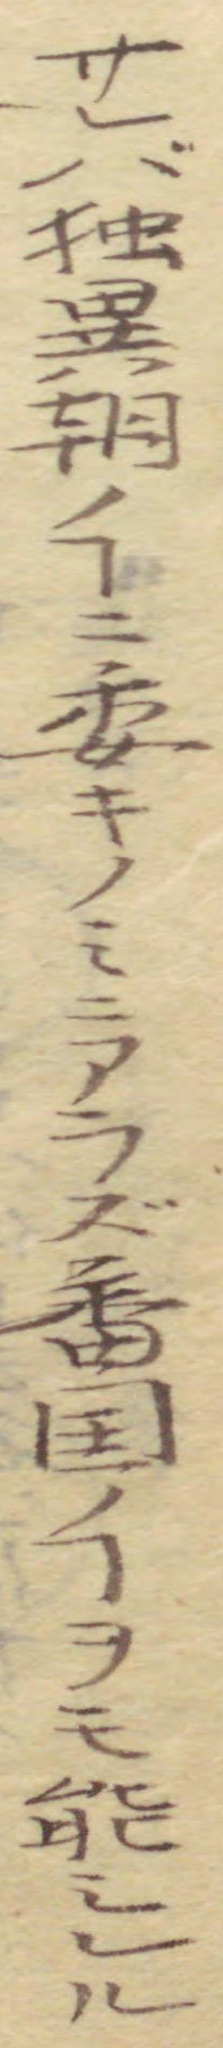サレバ独異朝ノコトニ委キノミニアラズ番国ノコトヲモ能シレル
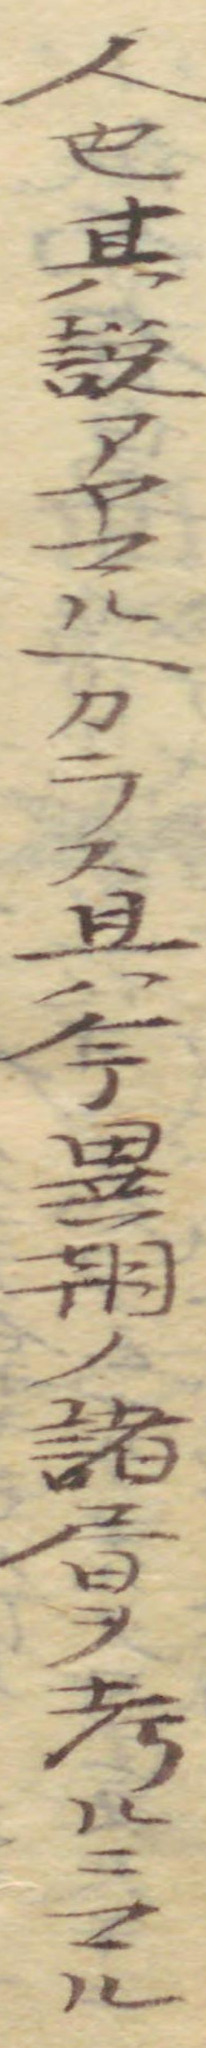人也其説アヤマルヘカラス且ハ今異朝ノ諸書ヲ考ルニマル
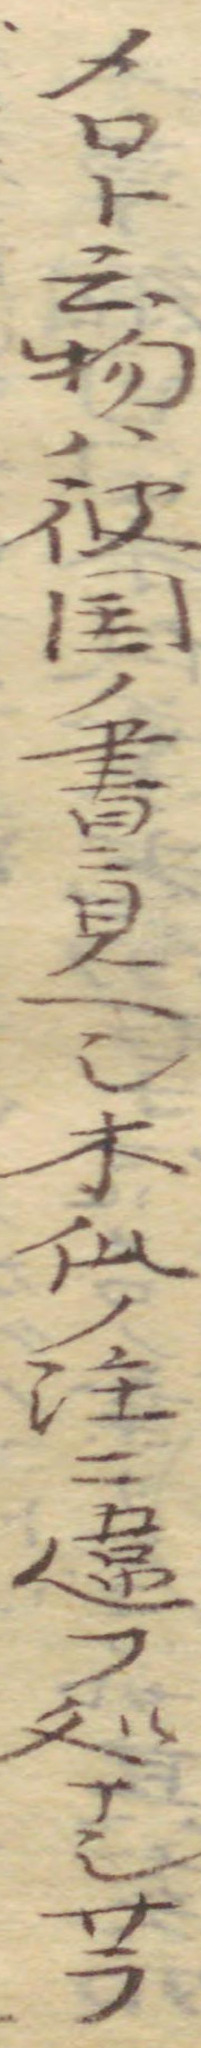メロト云物ハ彼国ノ書ニ見ヘシ木瓜ノ注ニ違フ処ナシサラ
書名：鶯宿雑記. 巻263-264
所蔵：国立国会図書館 National Diet Library, JAPAN
